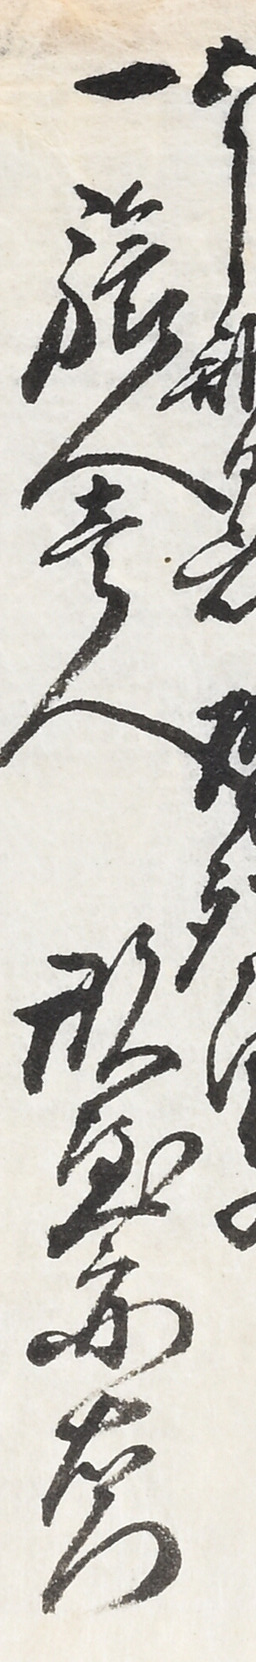一旅人壱人形屋亦右衛門
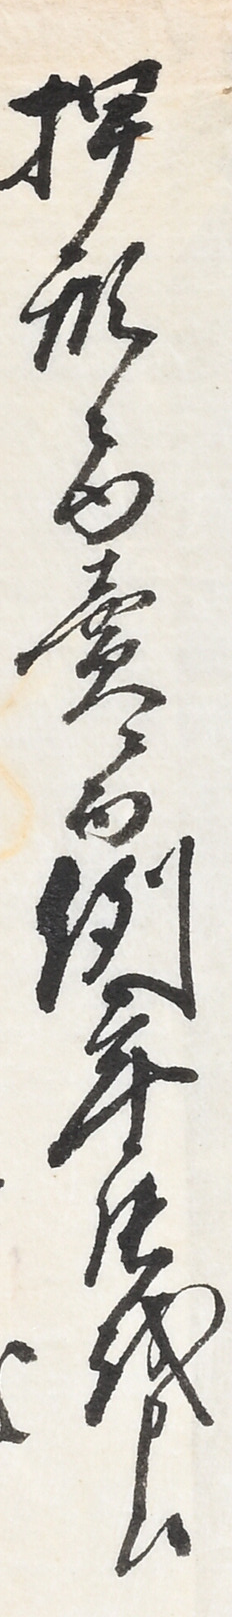押形商売ニ而例年罷越申候
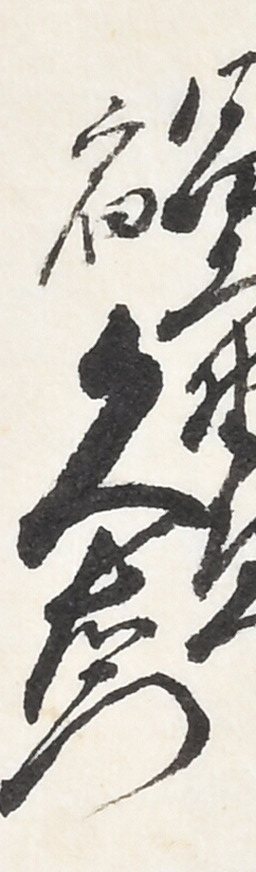宿久右衛門
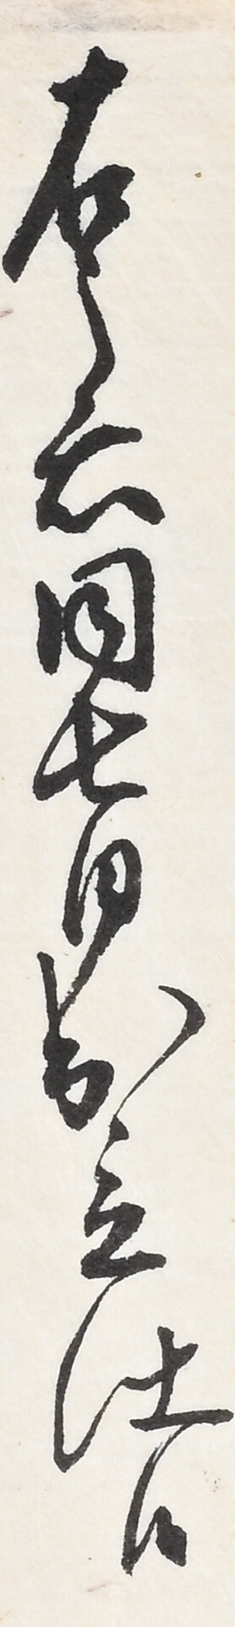右之者同七日出立仕候
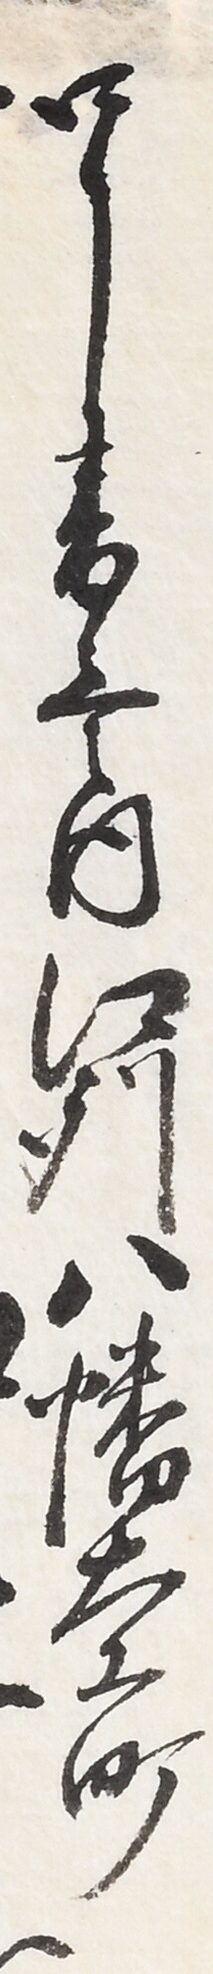四月書上之内江州八幡大工町
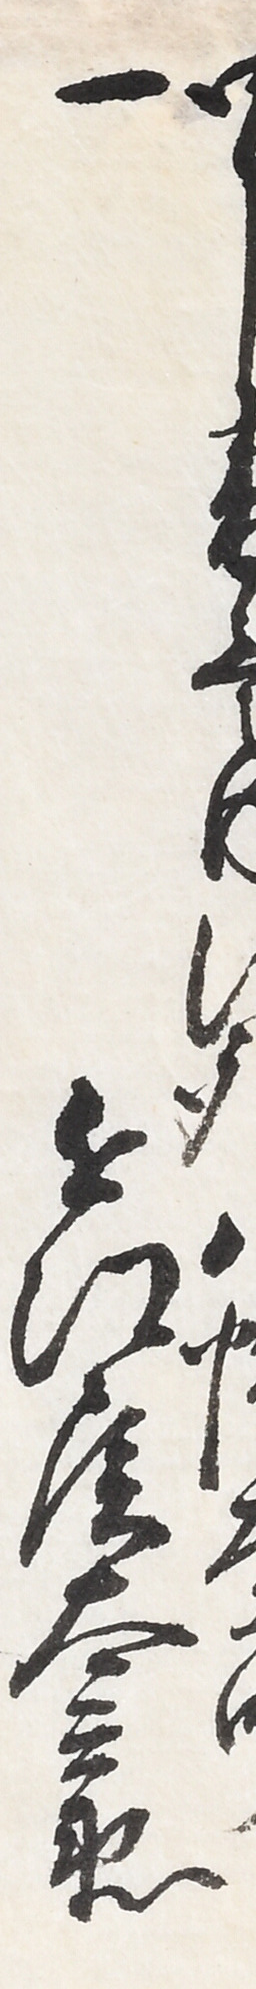一近江屋太兵衛
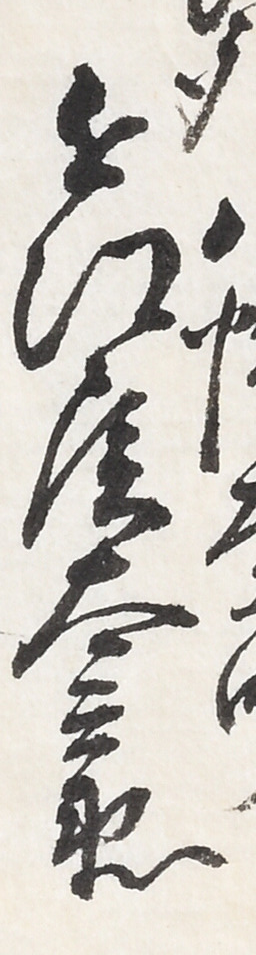一近江屋太兵衛
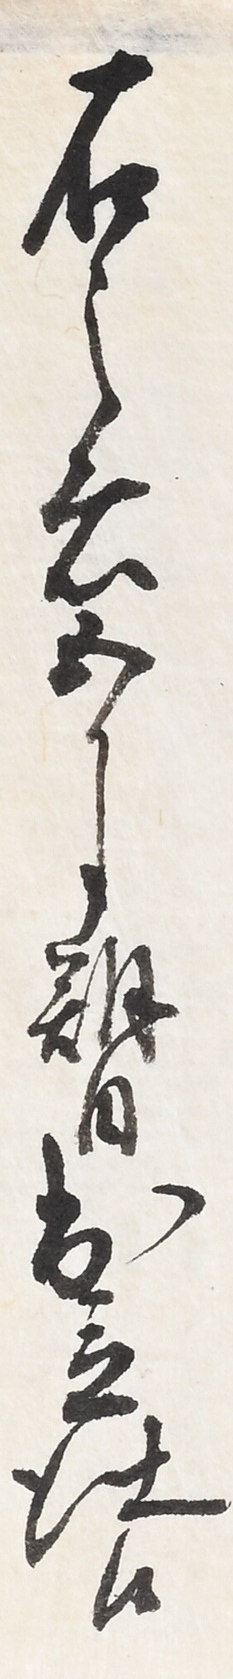右之者五月朔日出立仕候
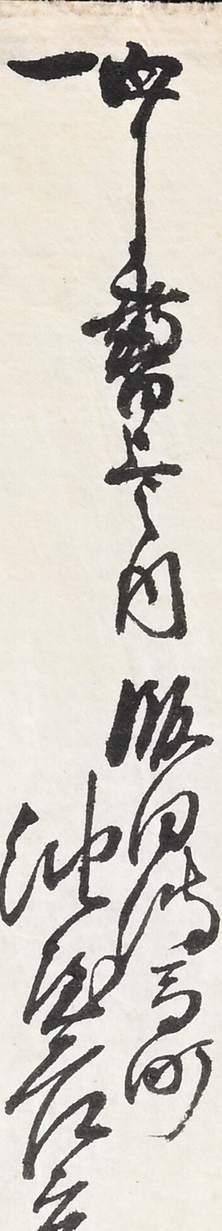五月書上之内飯田伝馬町
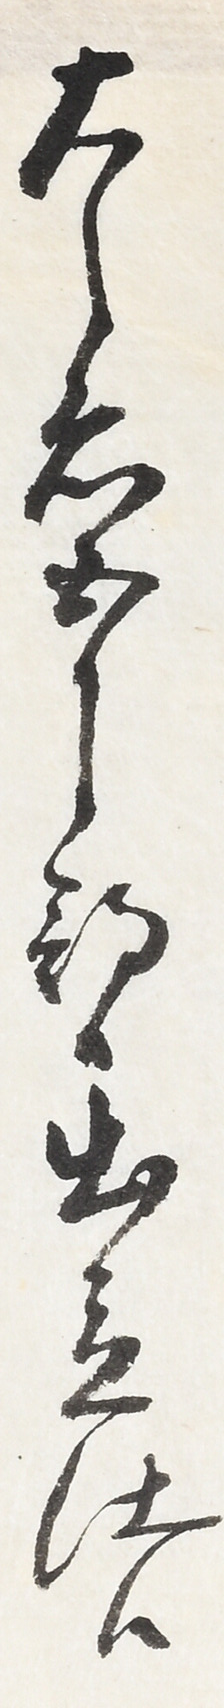右之者五月朔日出立仕候
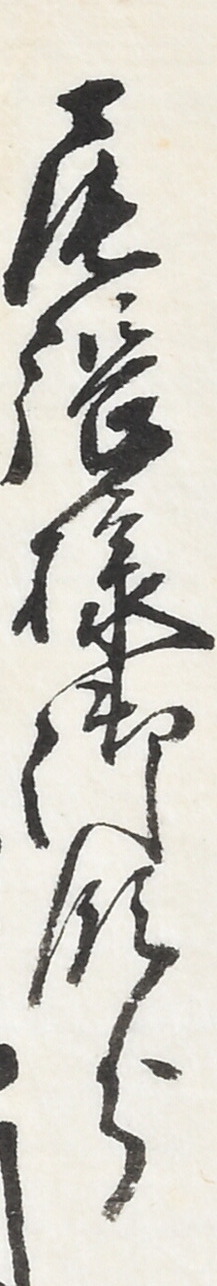尾張様御領分
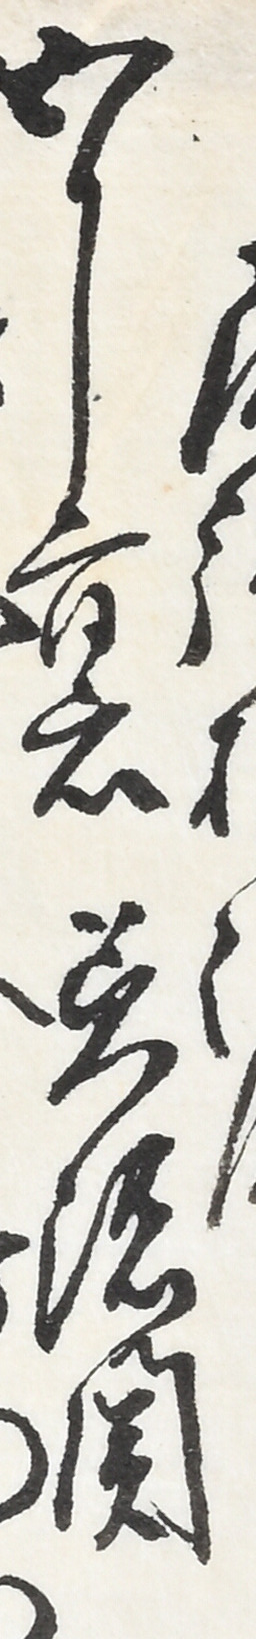五月二日着美濃関
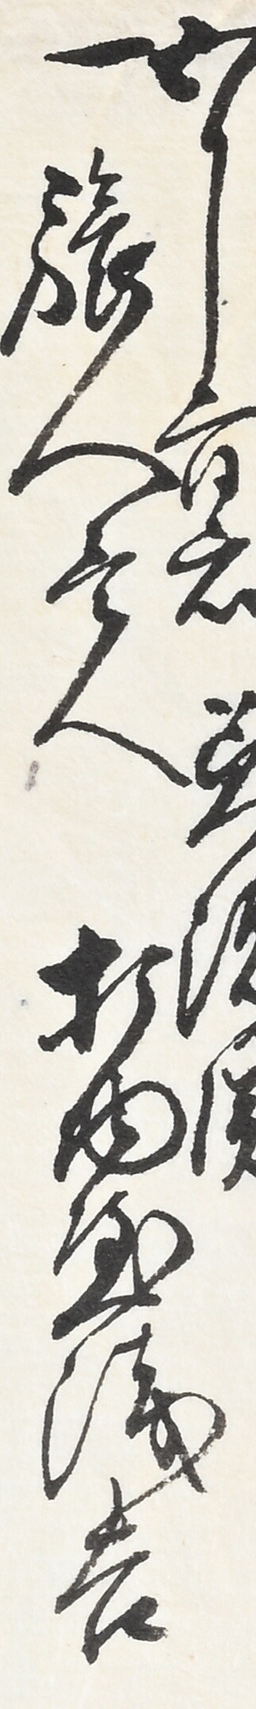一旅人壱人打物屋浅吉
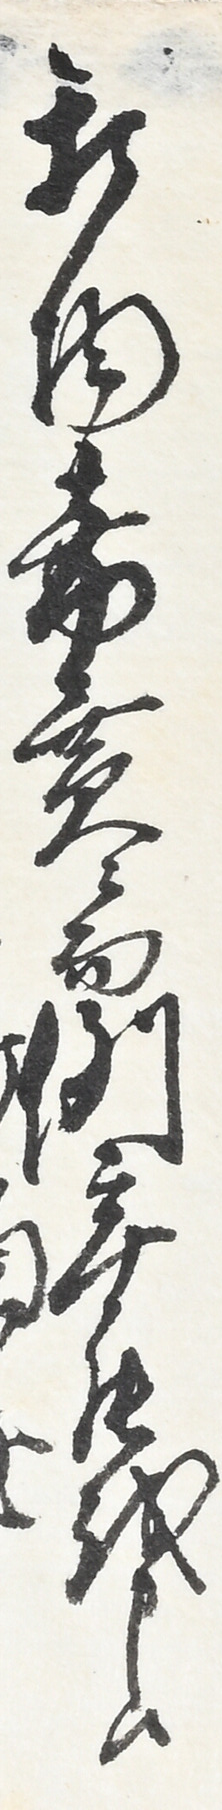押形商売ニ而例年罷越申候
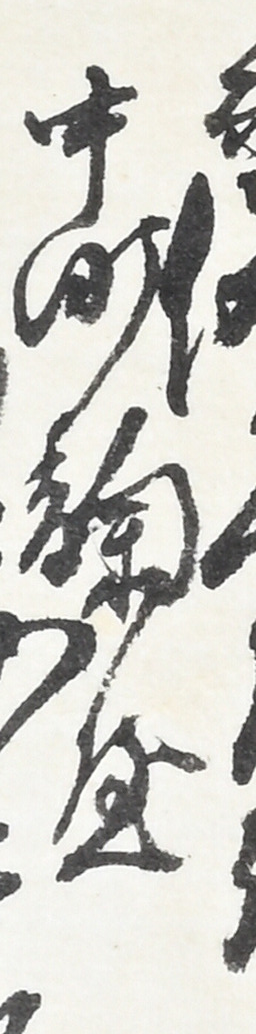中町麴屋
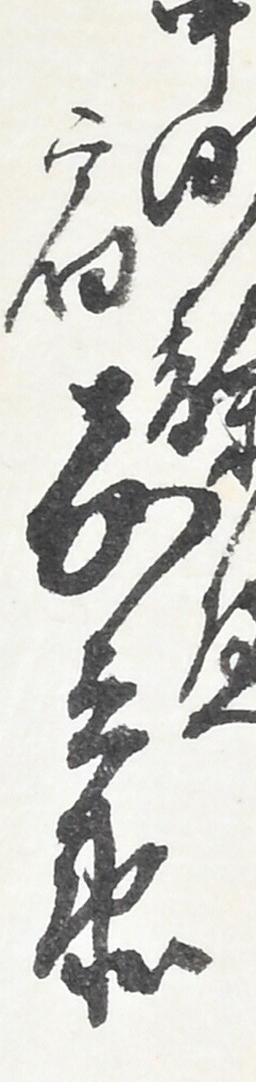宿嘉兵衛
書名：旅人泊控帳
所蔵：伊那市立高遠町図書館・合同会社AMANE
